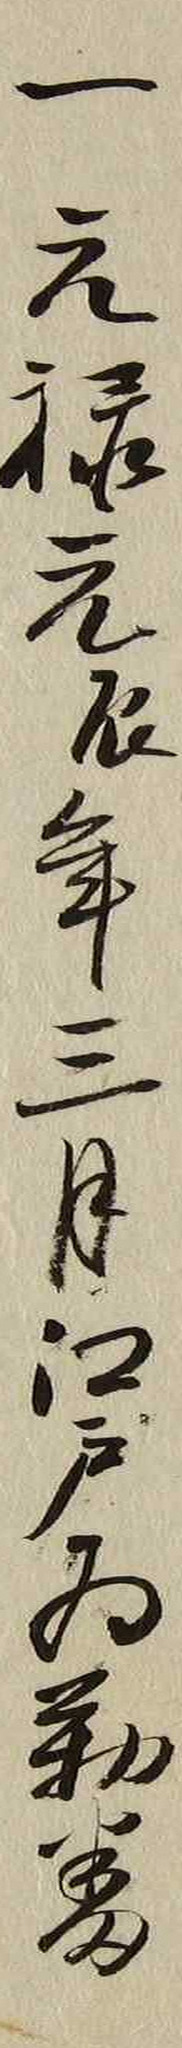一元禄元辰年三月江戸為勤番
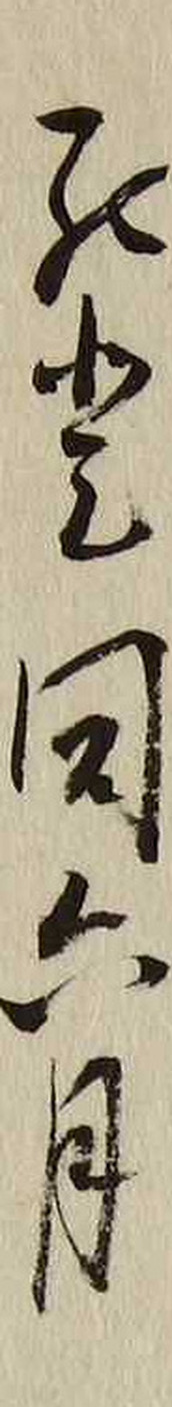罷登同六月
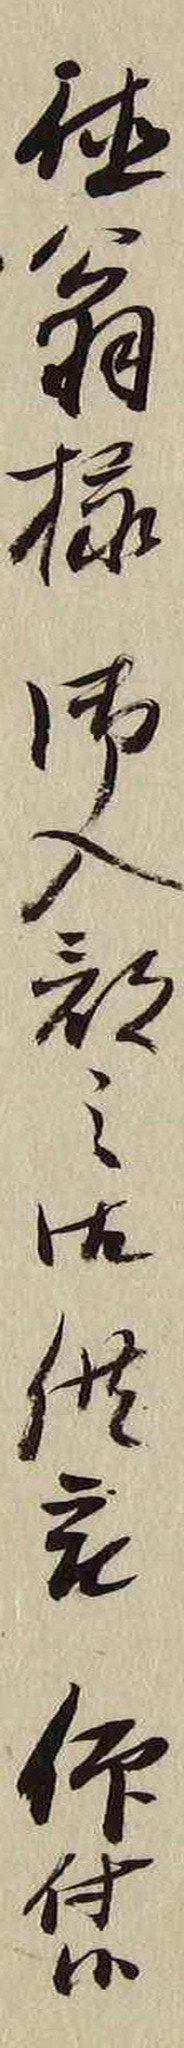徳翁様御入部之御供被仰付候
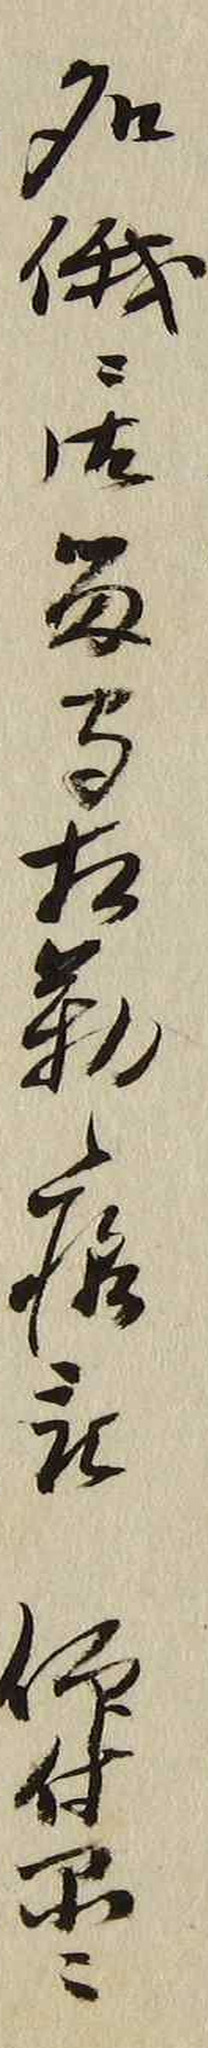処俄ニ御留守相勤候様被仰付品々
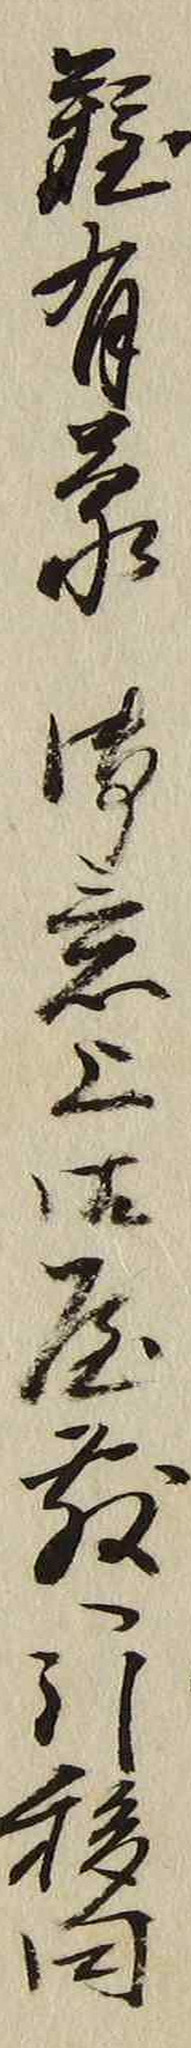難有蒙御意上御屋敷へ引移同
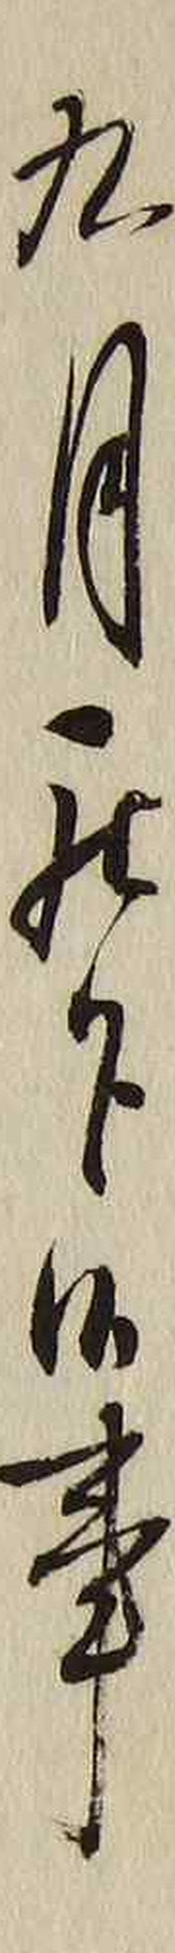九月罷下候事
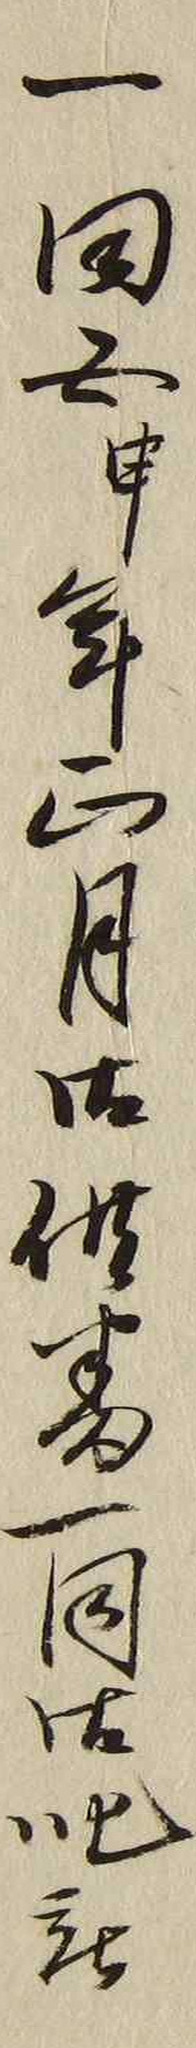一同五申年正月御供番一同御叱被

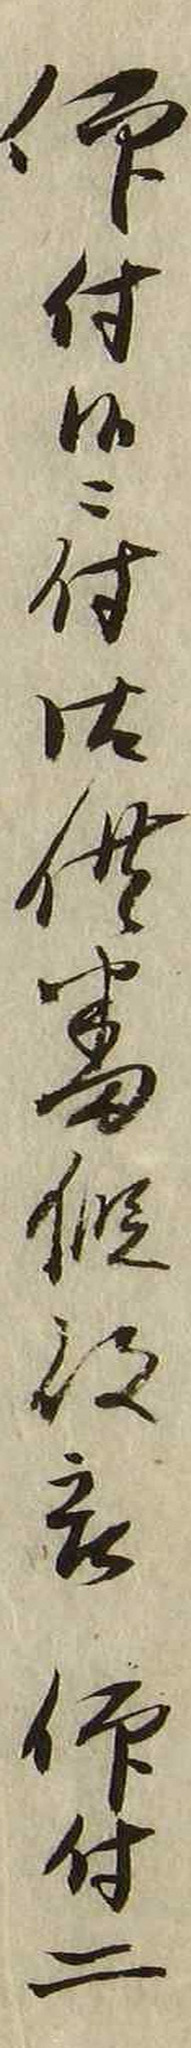仰付候ニ付御供番仮役被仰付二
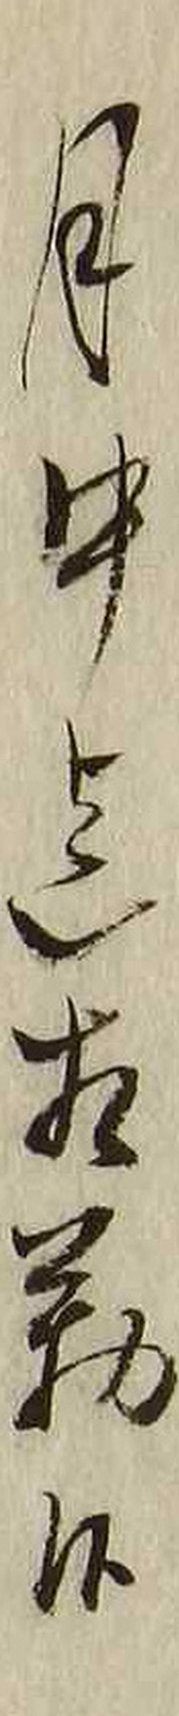月中迄相勤候
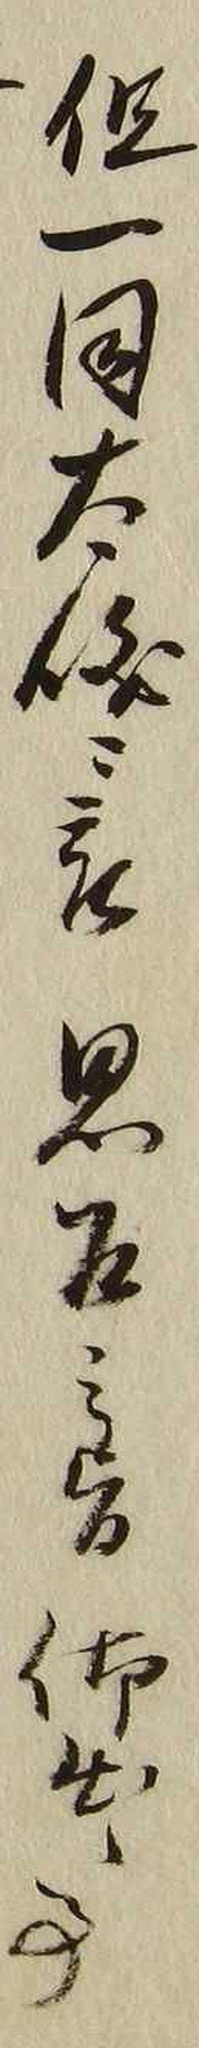但一同太儀ニ被思召之旨仰出候事
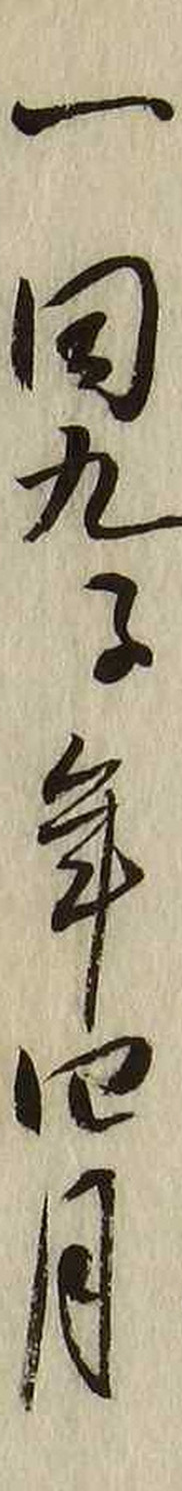一同九子年四月
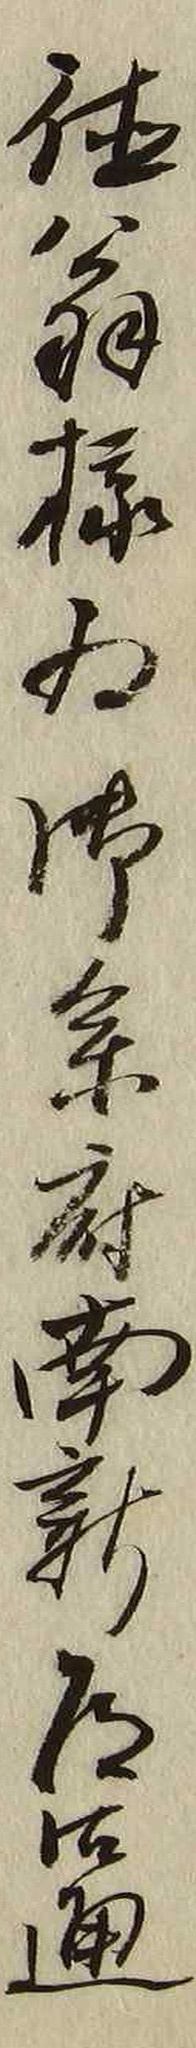徳翁様為御参府南新道御通
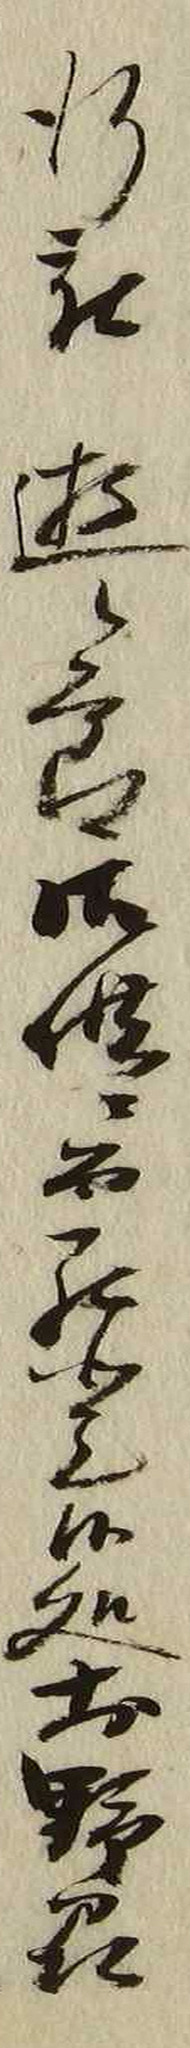行被遊候節御供ニ而罷登候処於野州
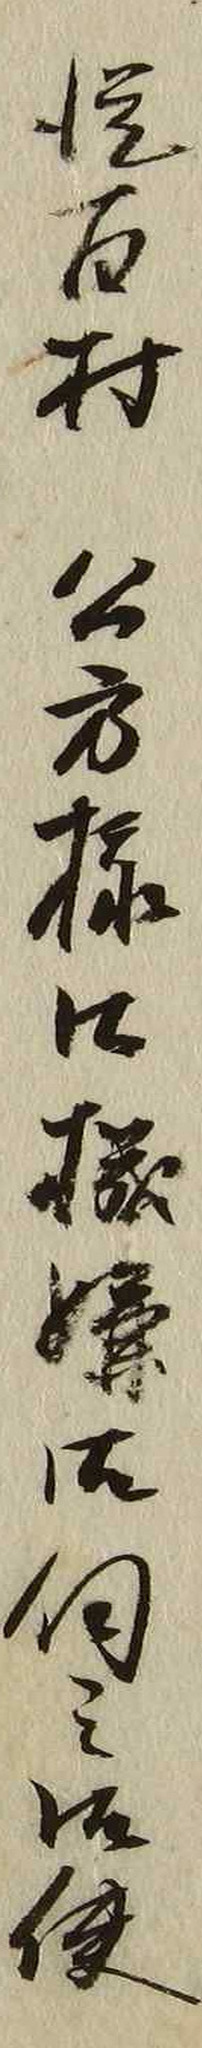従百村公方様御機嫌御伺之御使
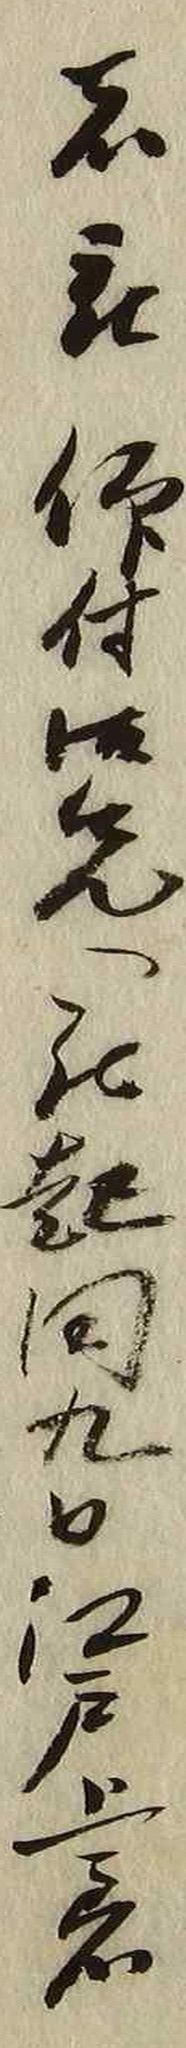者被仰付御先へ罷起同九日江戸上着
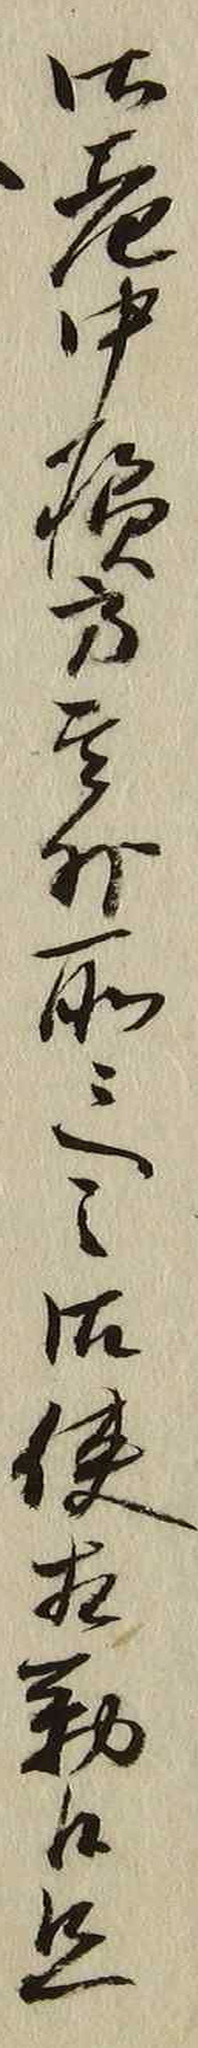御老中様方其外所々へ之御使相勤候且
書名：諸士系譜　巻之356　す之部6
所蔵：会津若松市立会津図書館
